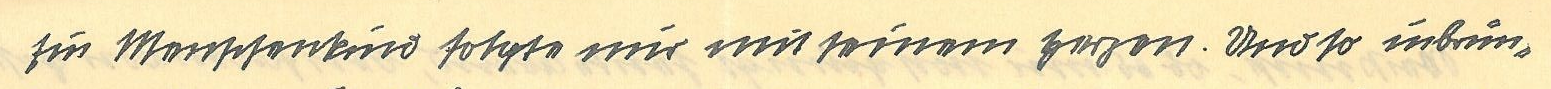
Ein Menschenkind folgte mir mit seinem Herzen. Und so inbrün¬
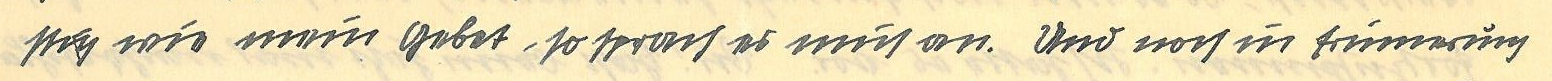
stig wie mein Gebet, so sprach es mich an. Und noch in Erinnerung
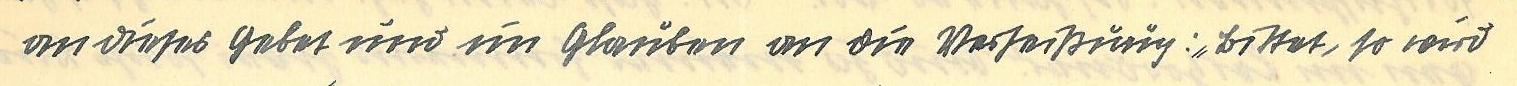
an dieses Gebet und im Glauben an die Verheißung: „Bittet, so wird
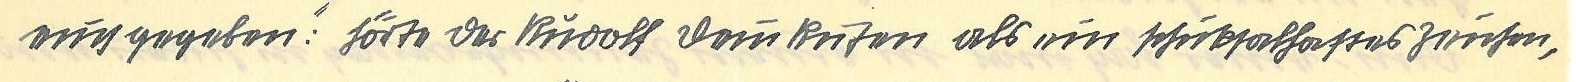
euch gegeben: hörte der Dein Rufen als ein schicksalhaftes Zeichen,
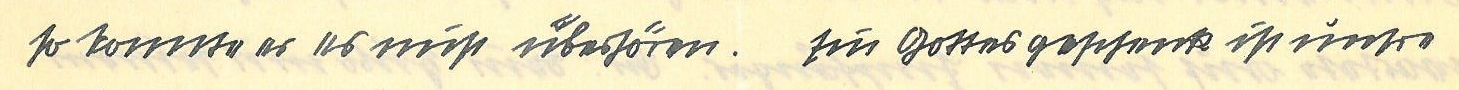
so konnte er es nicht überhören. Ein Gottesgeschenk ist unsre
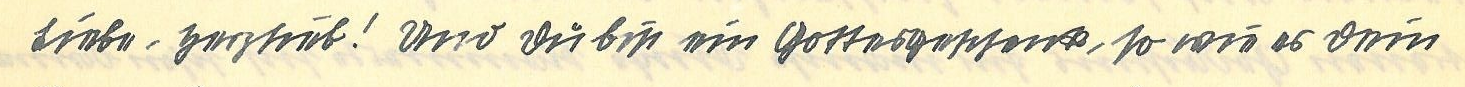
Liebe, Herzlieb! Und Du bist ein Gottesgeschenk.
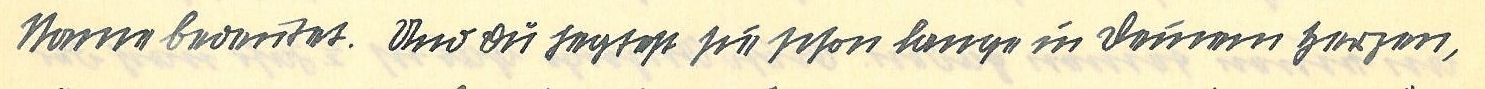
Und Du hegtest sie schon lange in Deinem Herzen,
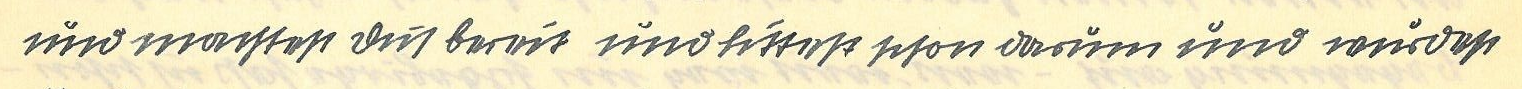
und machtest Dich bereit und littest schon darum und wurdest
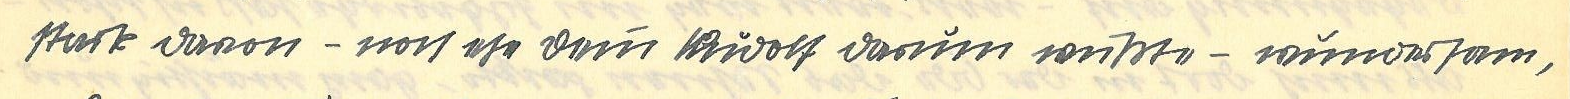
stark davon – noch ehe Dein darum wußte – wundersam,
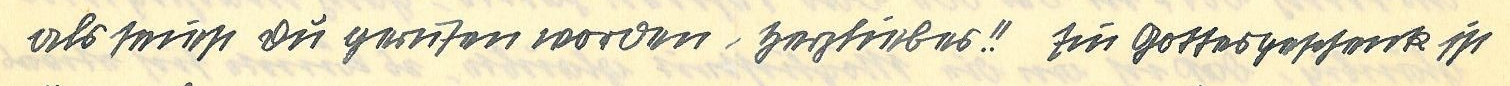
als seiest Du gerufen worden, Herzliebes!! Ein Gottesgeschenk ist
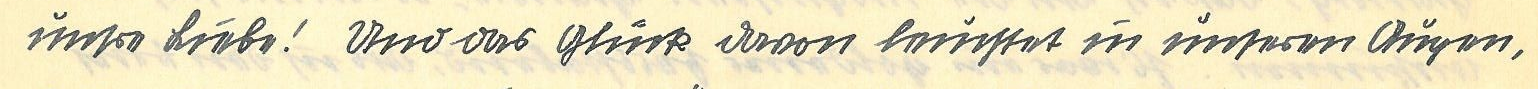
unsre Liebe! Und das Glück davon leuchtet in unseren Augen,
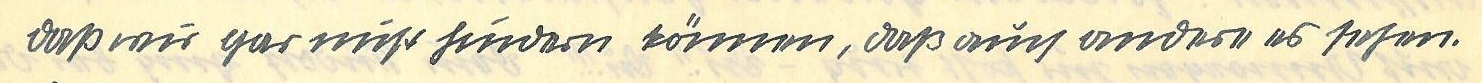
daß wir gar nicht hindern können, daß auch andere es sehen.
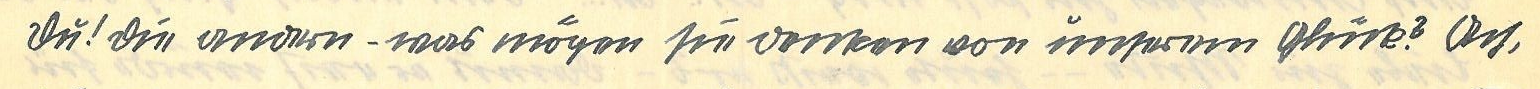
Du! Die andern – was mögen sie denken von unserem Glück? Ach,
